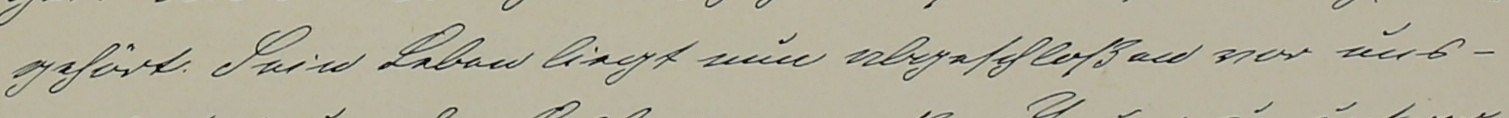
gehört. Sein Leben liegt nun abgeschloßen vor uns –
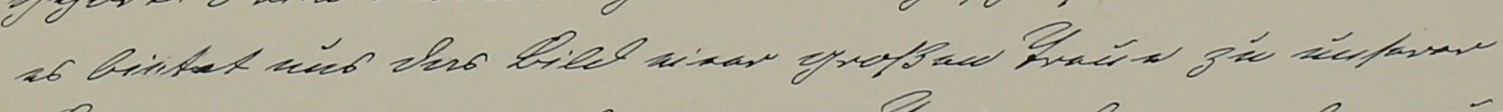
es bietet uns das Bild einer großen Treue zu unserer
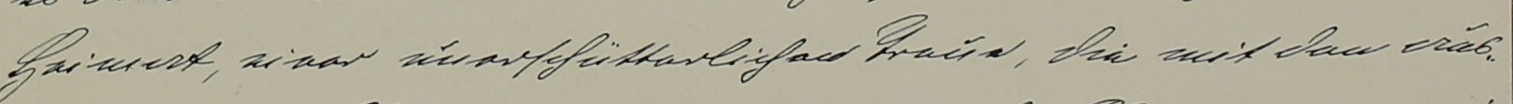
Heimat, einer unerschütterlichen Treue, die mit den aus-
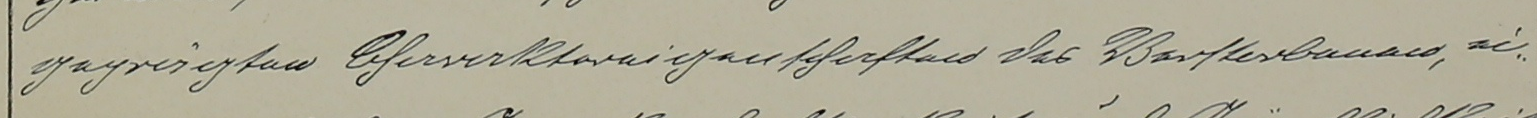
geprägten Charaktereigenschaften des Verstorbenen, ei-
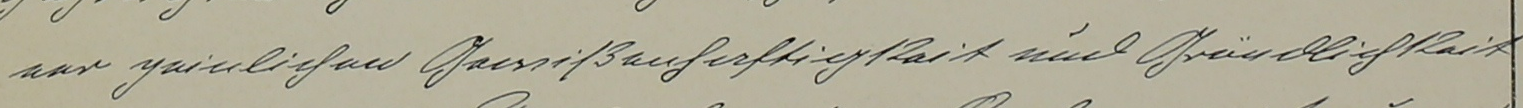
ner peinlichen Gewißenhaftigkeit und Gründlichkeit
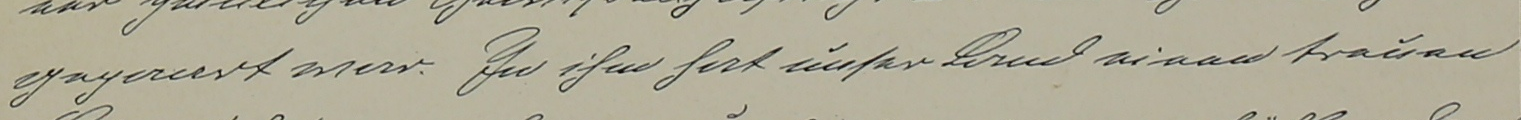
gepaart war. In ihm hat unser Land einen treuen
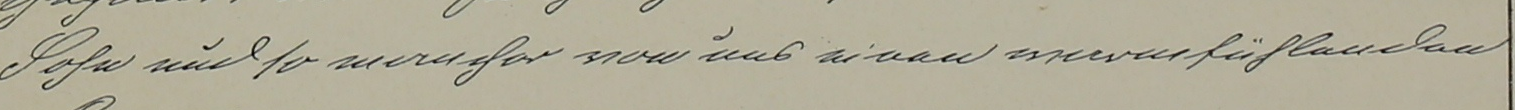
Sohn und so mancher von uns einen warmfühlenden
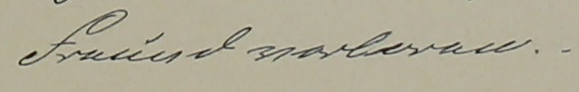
Freund verloren.
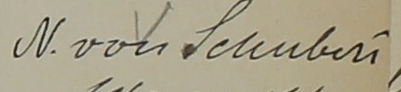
N. von Schubert
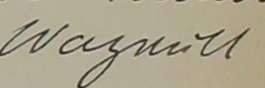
Wayküll
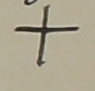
†
